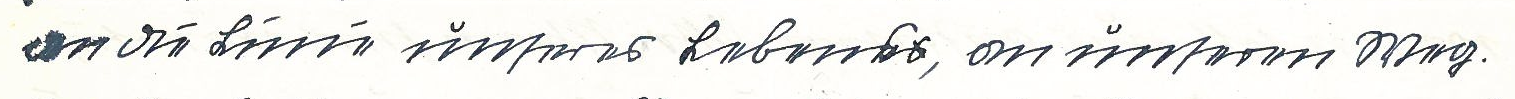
an die Linie unseres Lebenss, an unseren Weg.
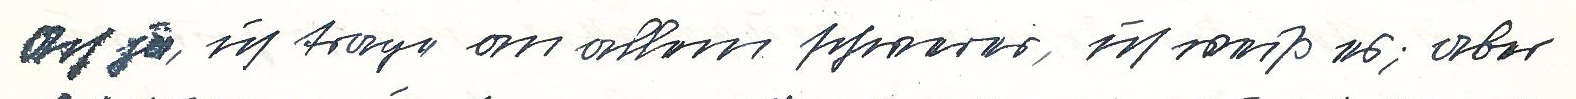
Ach ja, ich trage an allem schwerer, ich weiß es; aber
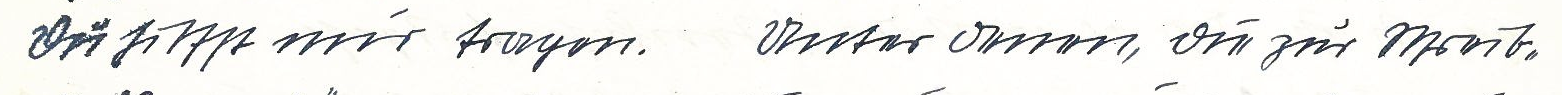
Du hilfst mir tragen. Unter denen, die zur Schreib¬
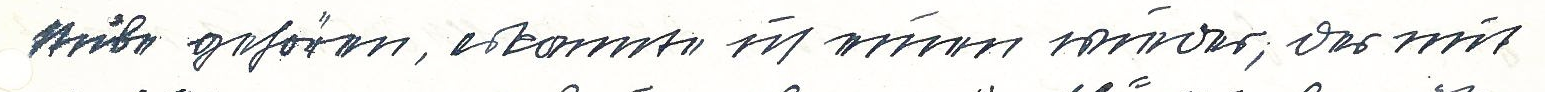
stube gehören, erkannte ich einen wieder, der mit
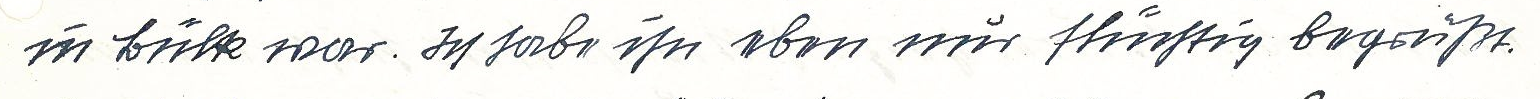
in Bülte war. Ich habe ihn eben nur flüchtig begrüßt.
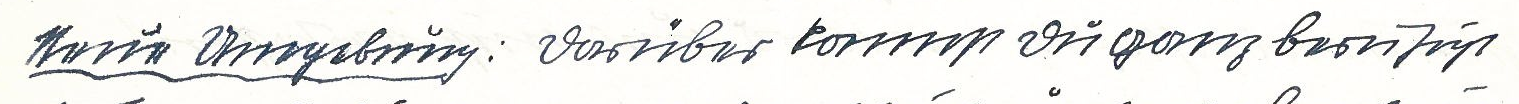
Neue Umgebung: Darüber kannst Du ganz beruhigt
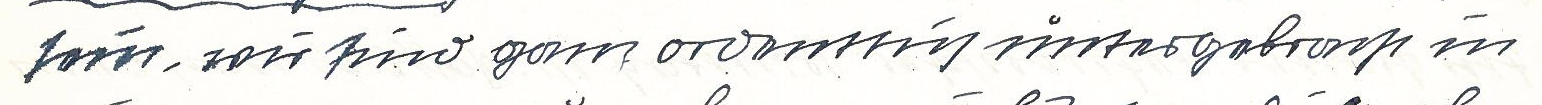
sein, wir sind ganz ordentlich untergebracht in
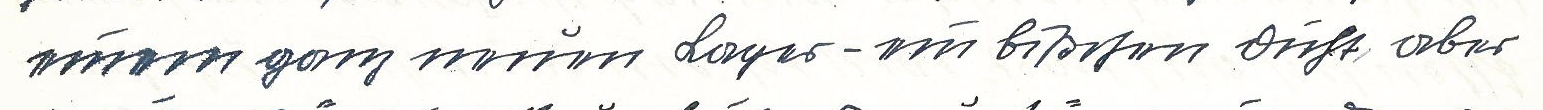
einem ganz neuen Lager – ein bißchen dicht, aber
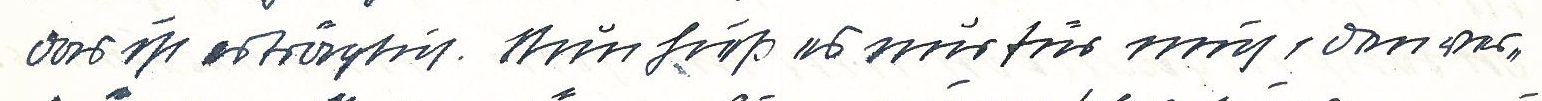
das ist erträglich. Nun hieß es nur für mich, den ver¬
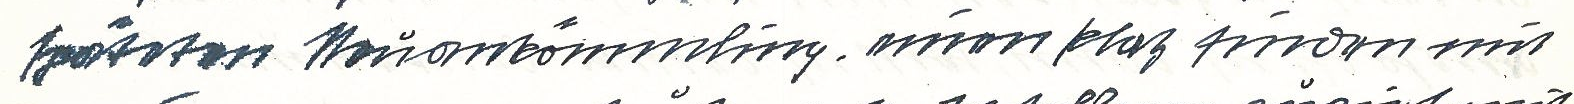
späteten Neuankömmling, einen Platz finden mit
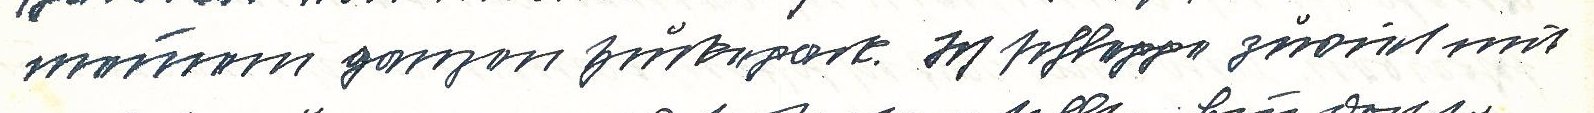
meinem ganzen Huckepack. Ich schleppe zuviel mit
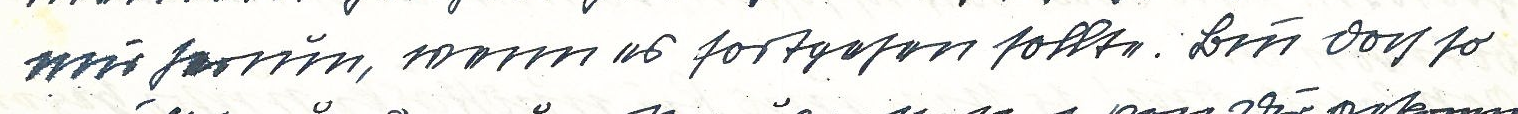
mir herum, wenn es fortgehen sollte. Bin doch so
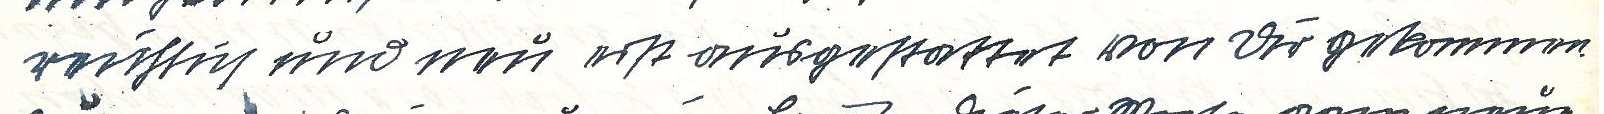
reichlich und neu erst ausgestattet von Dir gekommen.
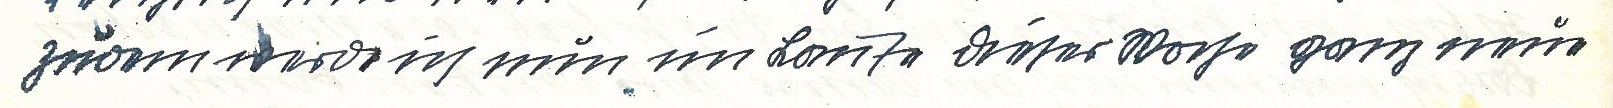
Zudem werde ich nun im Laufe dieser Woche ganz neue
